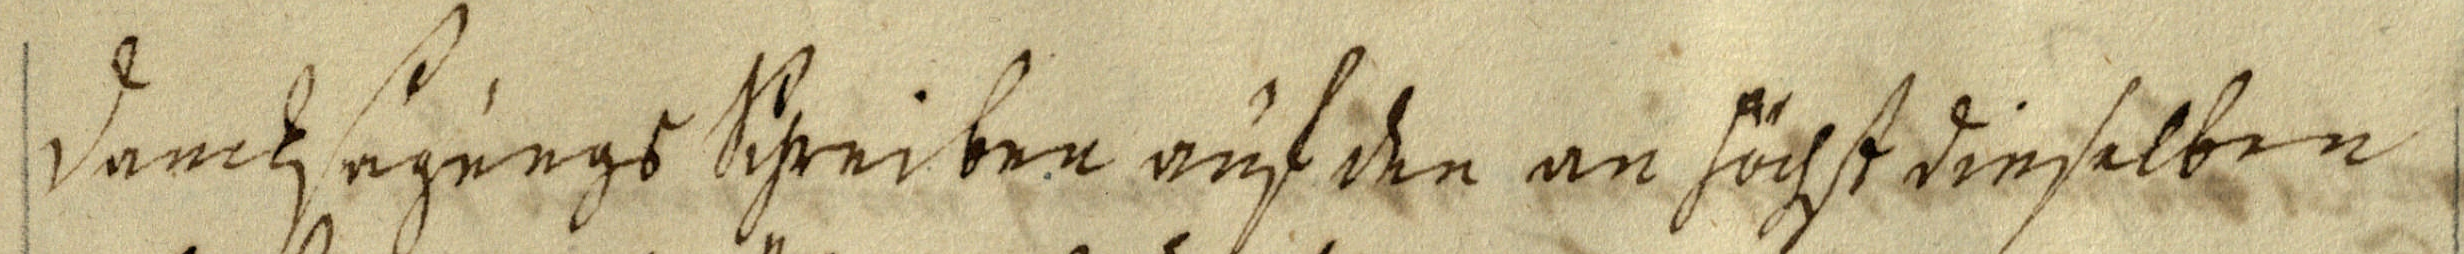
Dancksagungs Schreiben auf den an höchst dieselben
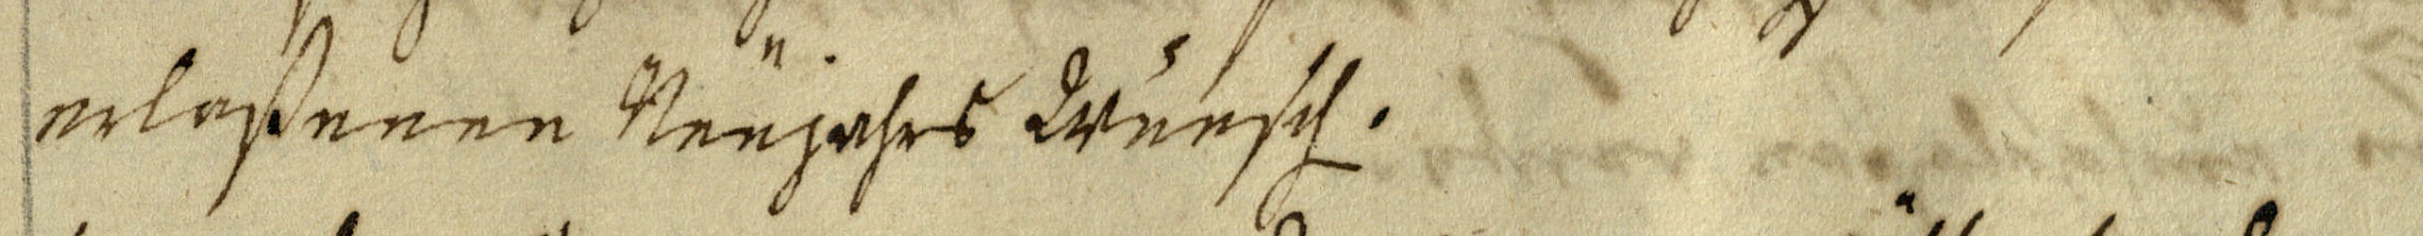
erlaßenen Neujahrs Wunsch.
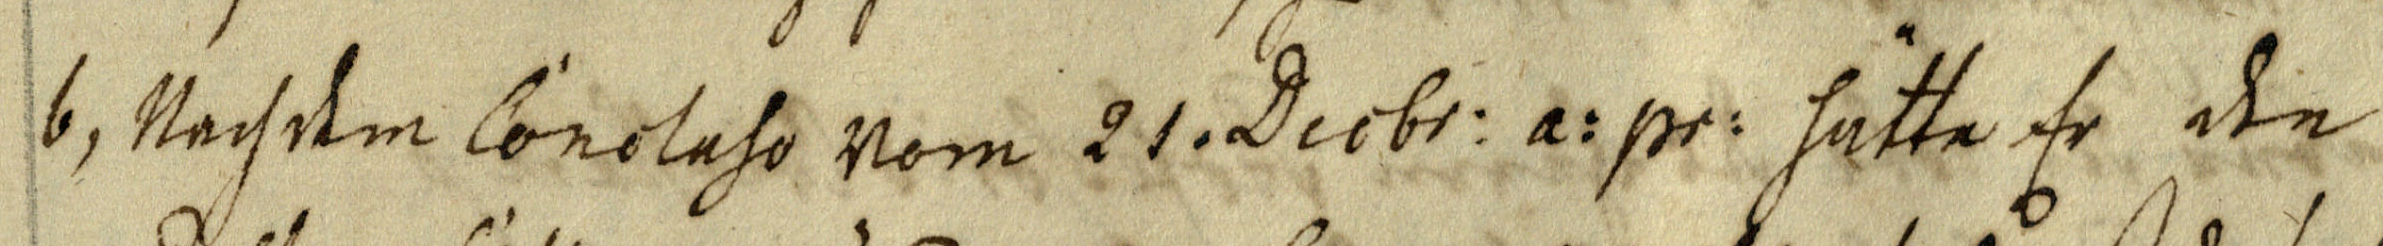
b, Nach dem Concluso vom 21. Decbr. a. pr. hätte Er den
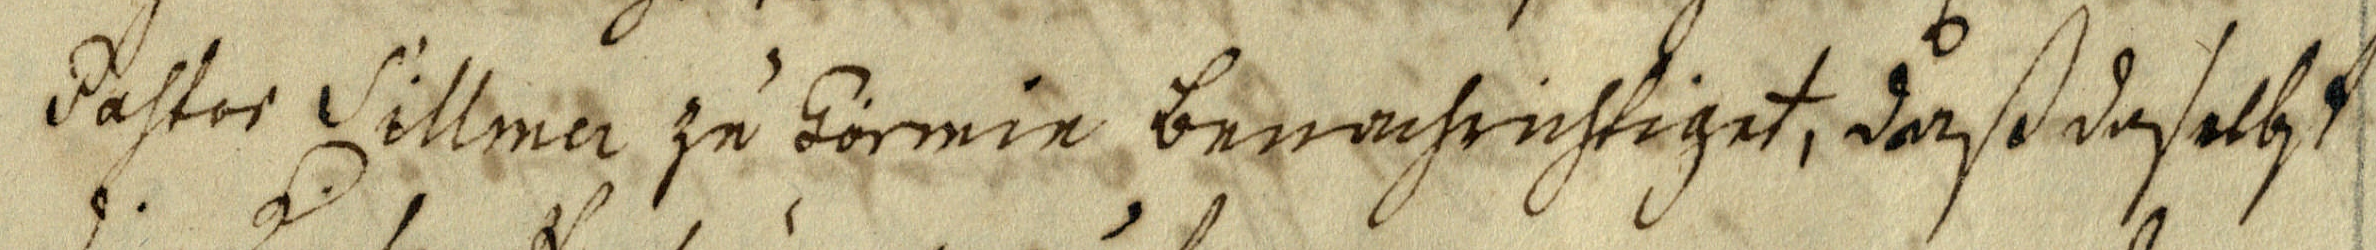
Pastor Sillmer zu Görmin benachrichtiget, daß daselbst
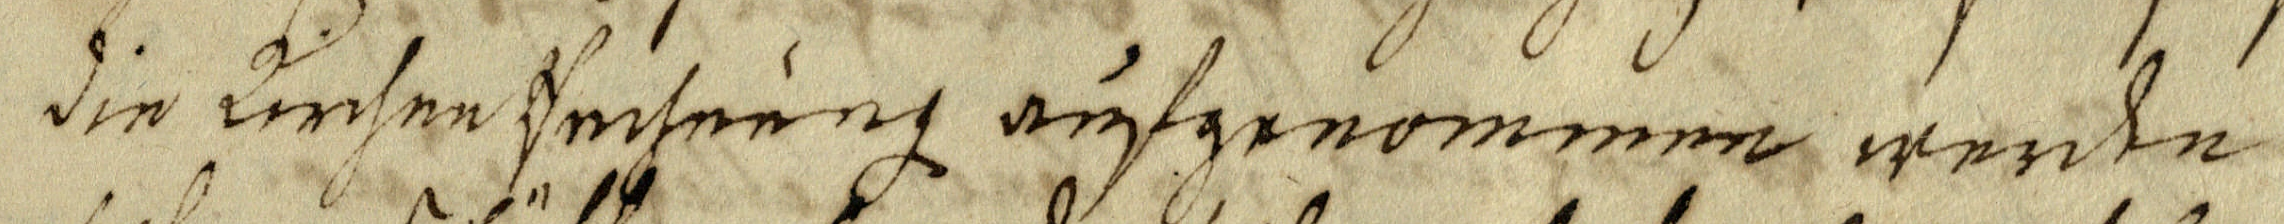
die Kirchen Rechnung aufgenommen werden
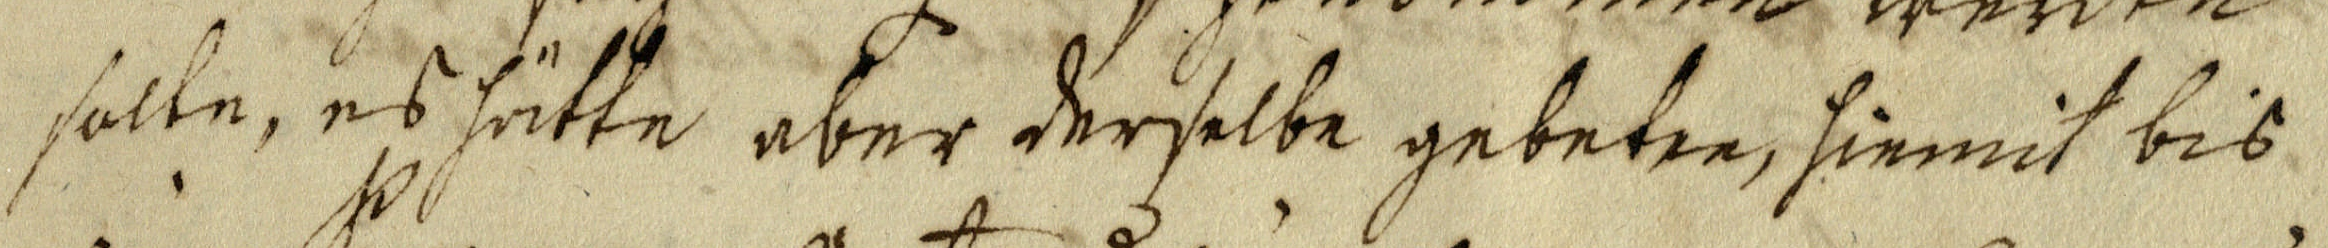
solte, es hätte aber derselbe gebeten, hiemit bis
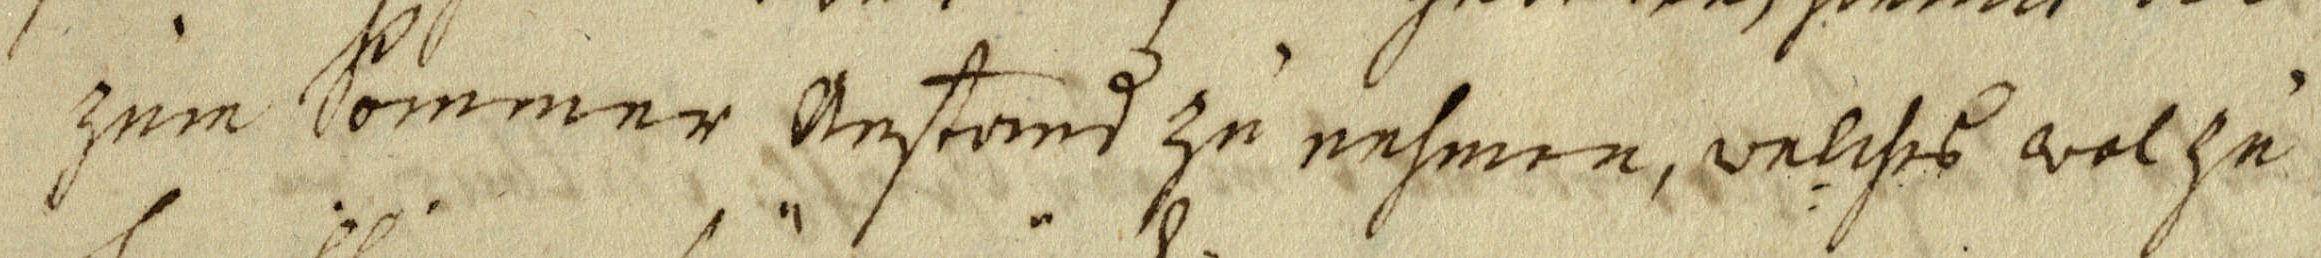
zum Sommer Anstand zu nehmen, welches wol zu
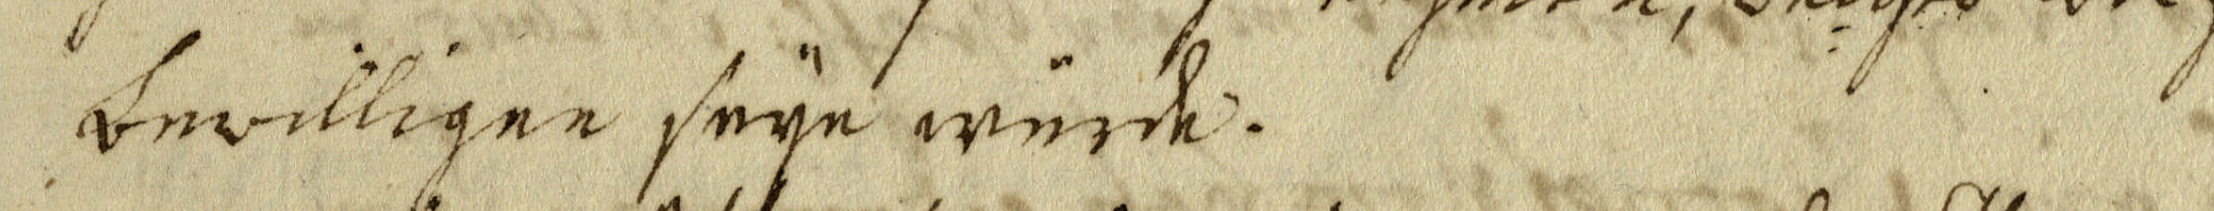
bewilligen seÿn würde.
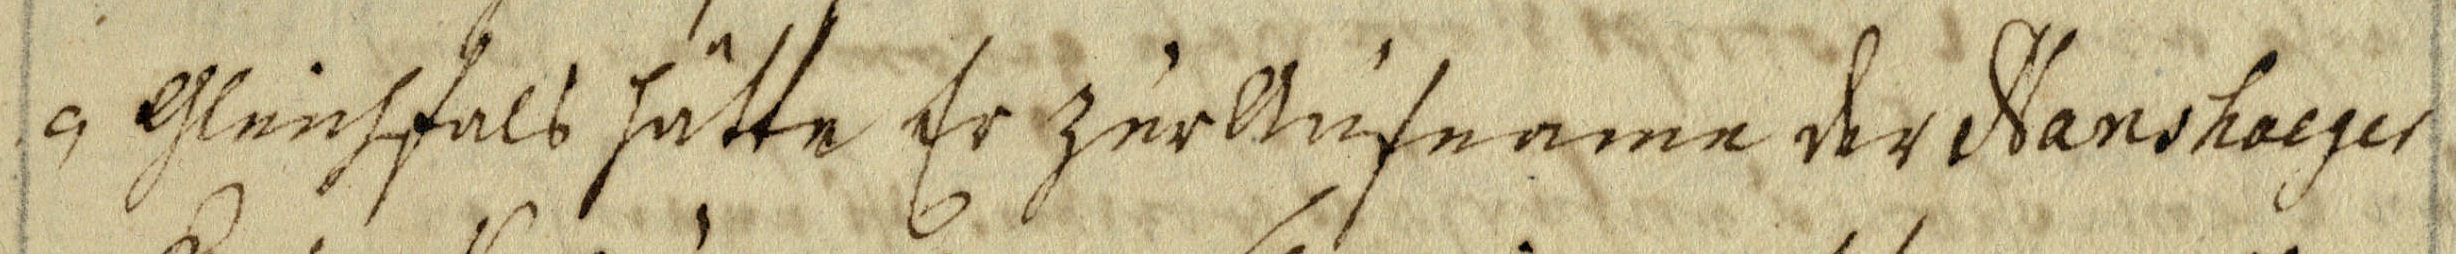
c, Gleichfals hätte Er zur Aufname der Hanshaeger
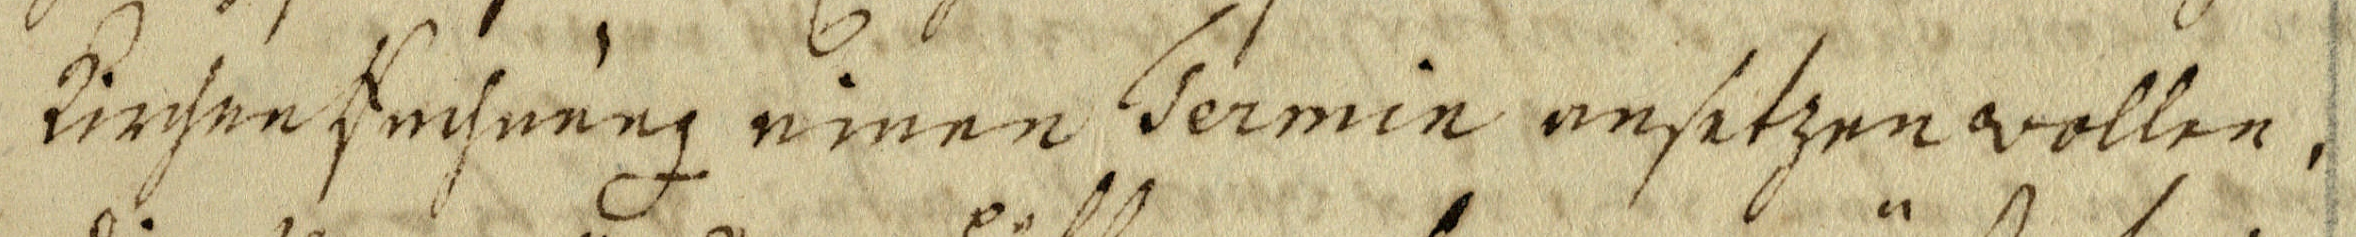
KirchenRechnung einen Termin ansetzen wollen,
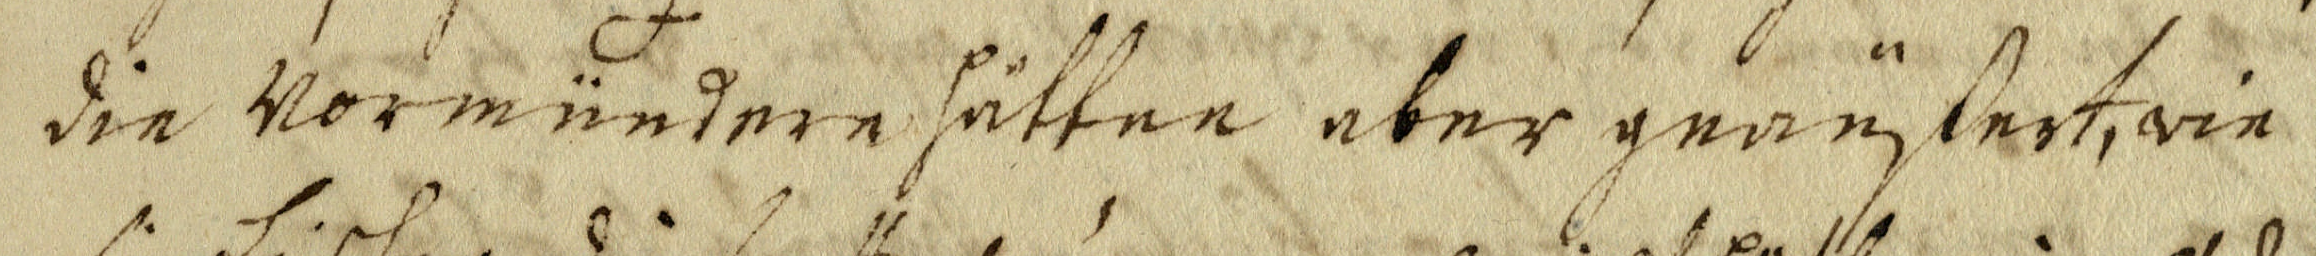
die Vormündern hätten aber geäußert, wie
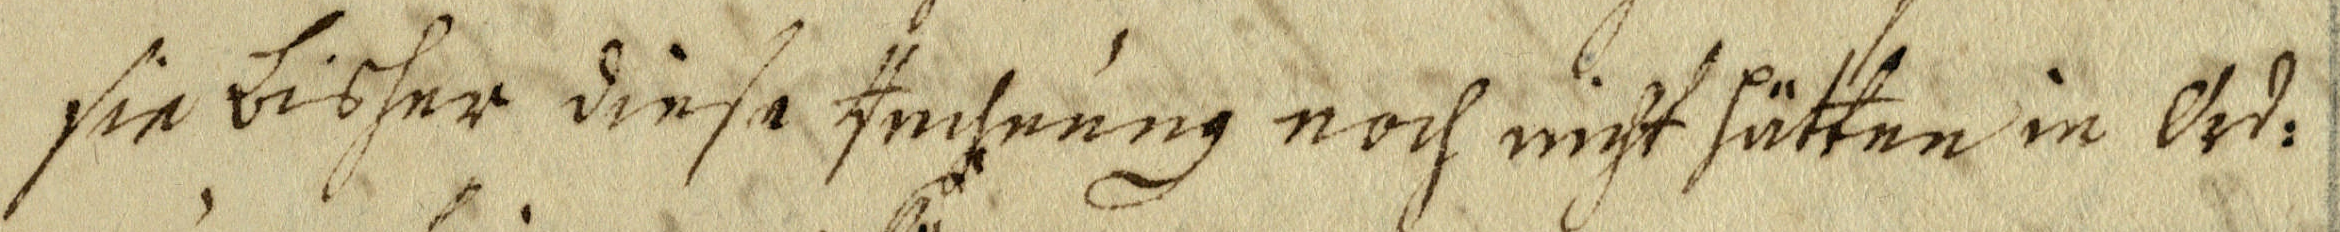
sie bisher diese Rechnung noch nicht hätten in Ord¬
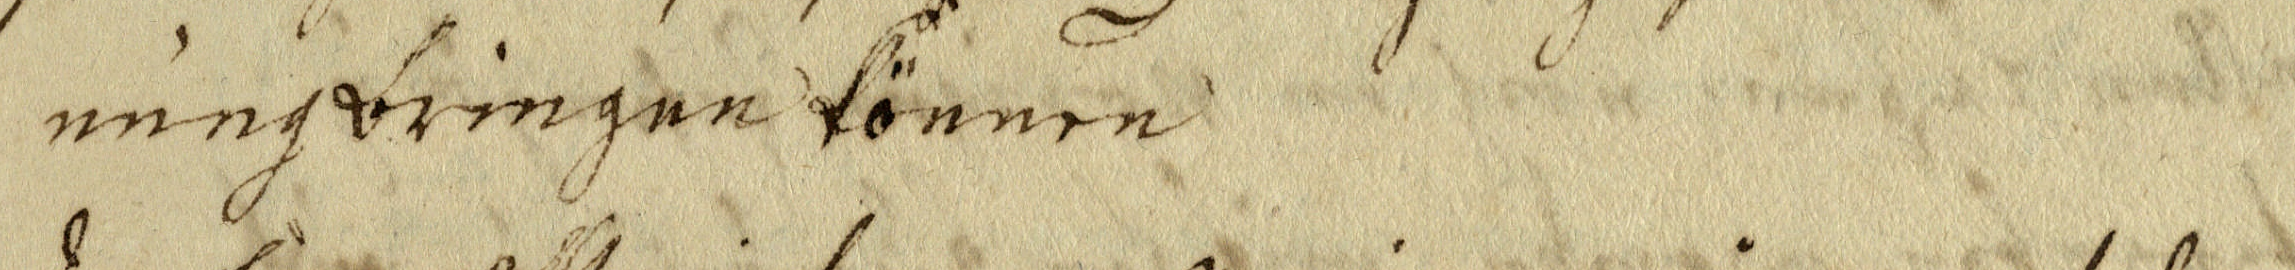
nung bringen können.
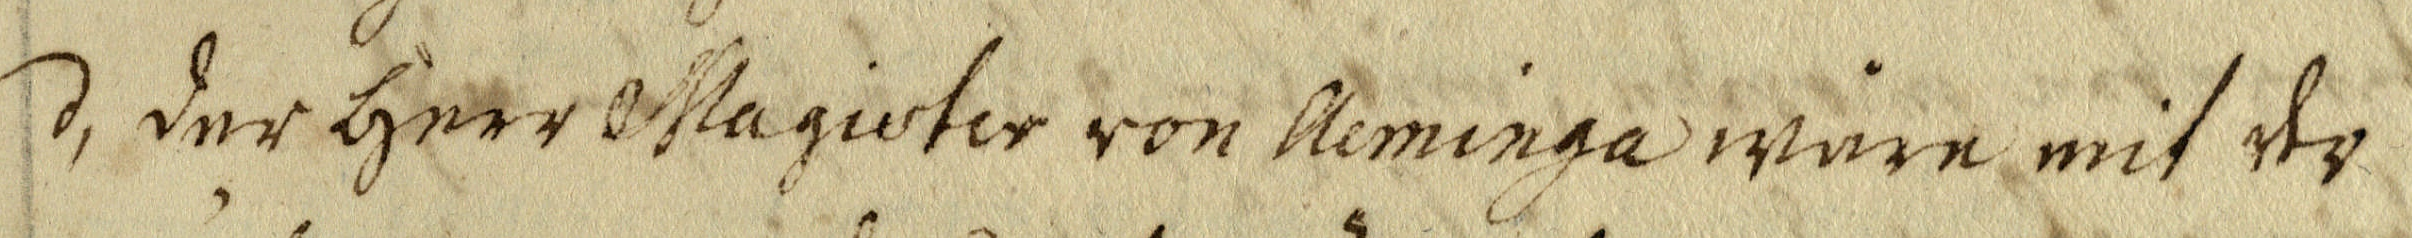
d, der Herr Magister von Aeminga wäre mit der
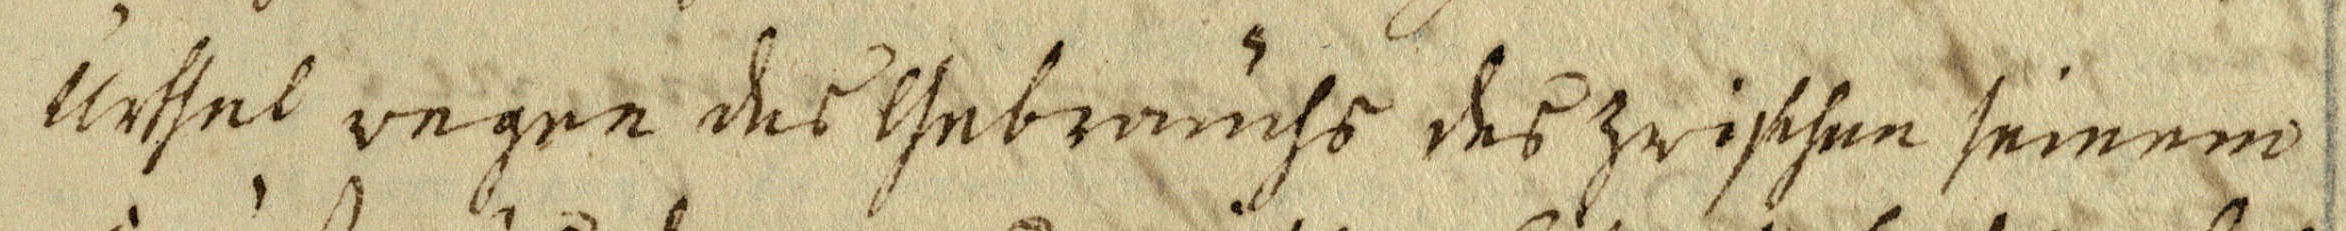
Urthel wegen des Gebrauchs des zwischen seinem
